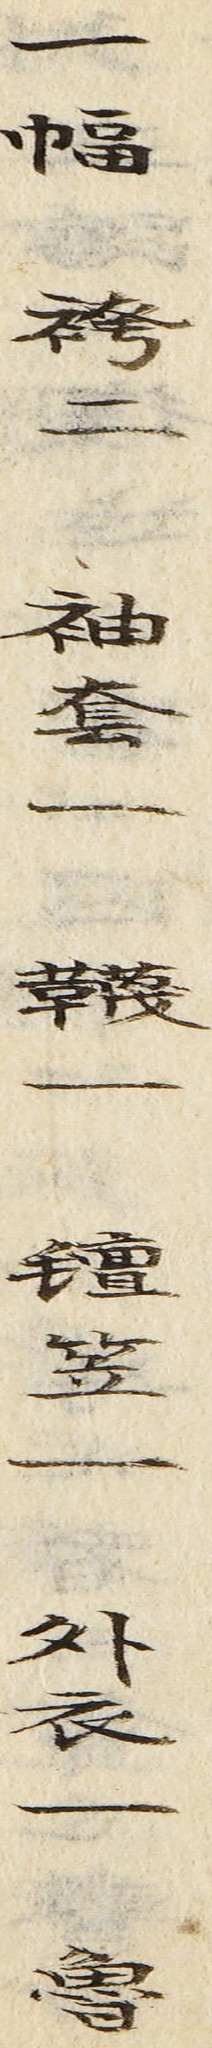一幅袴二袖套一韈一氈笠一外衣一魯
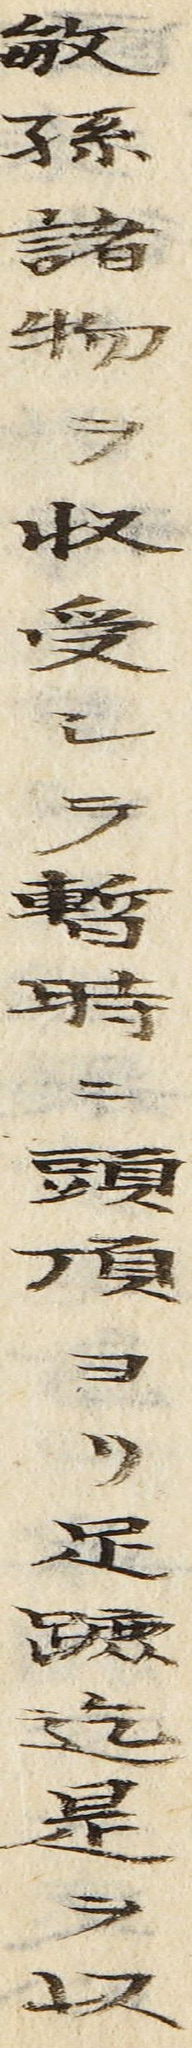敏孫諸物ヲ収受シテ暫時ニ頭頂ヨリ足蹠迄是ヲ以
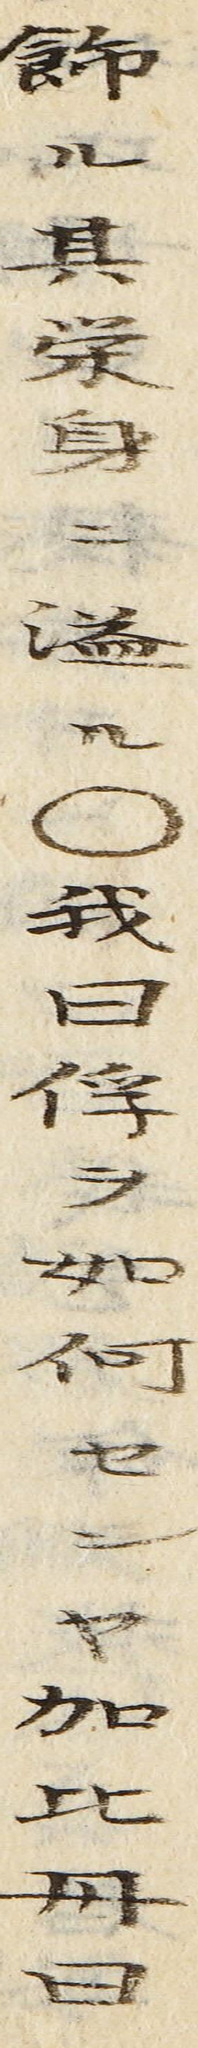飾ル其栄身ニ溢ル◯我曰俘ヲ如何センヤ加比丹曰
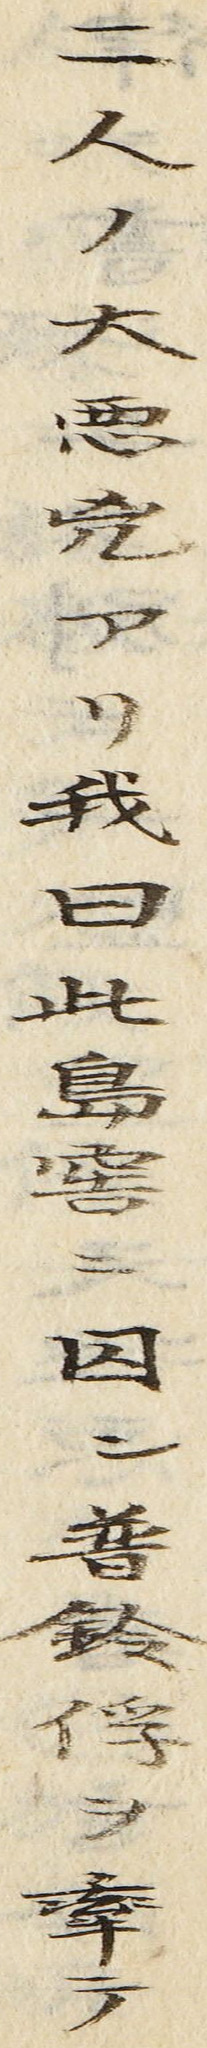二人ノ大悪兇アリ我曰此島窖ニ囚ン普鈴俘ヲ率テ
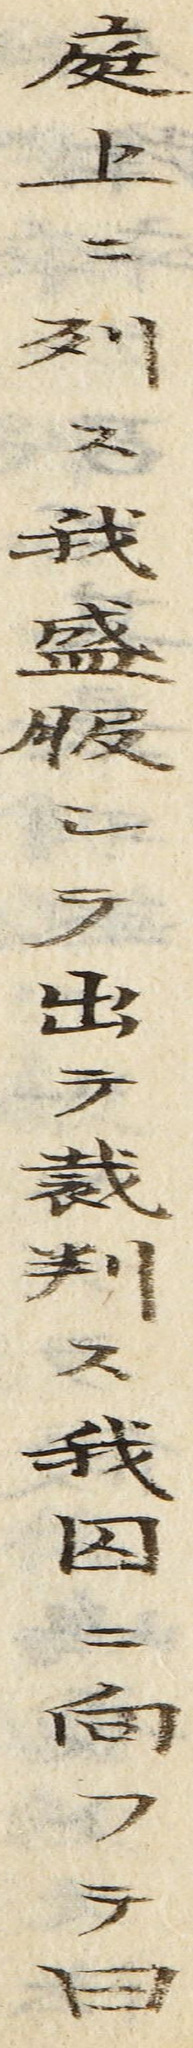庭上ニ列ス我盛服シテ出テ裁判ス我囚ニ向フテ曰
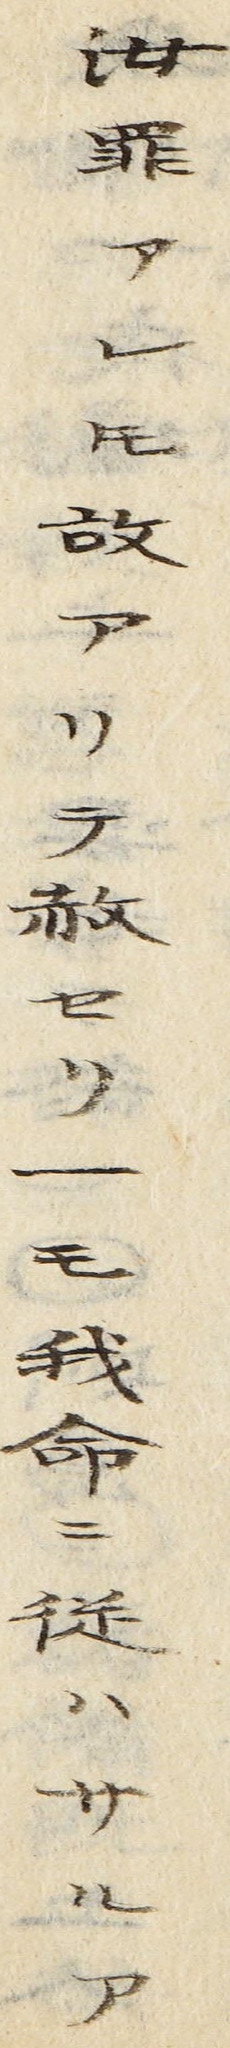汝罪アレトモ故アリテ赦セリ一モ我命ニ従ハサルア
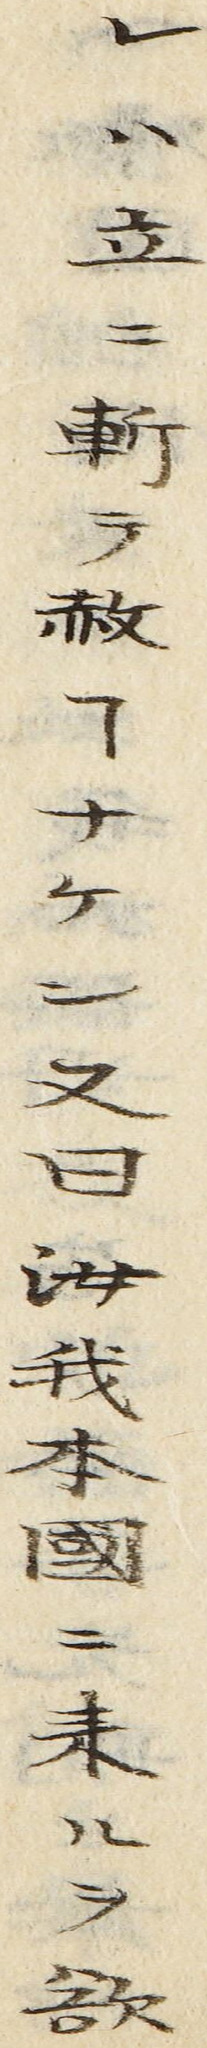レハ立ニ斬テ赦コトナケン又曰汝本国ニ来ルヲ欲
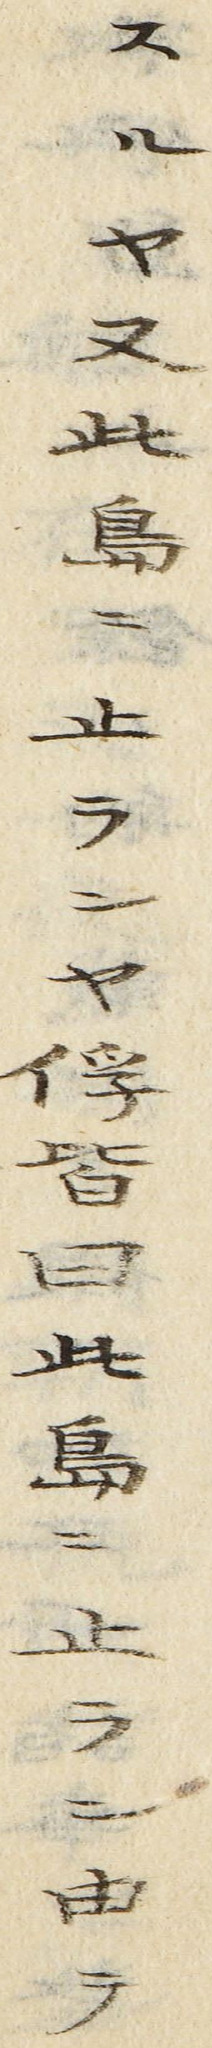スルヤ又此島ニ止ランヤ俘皆曰此島ニ止ラン由テ

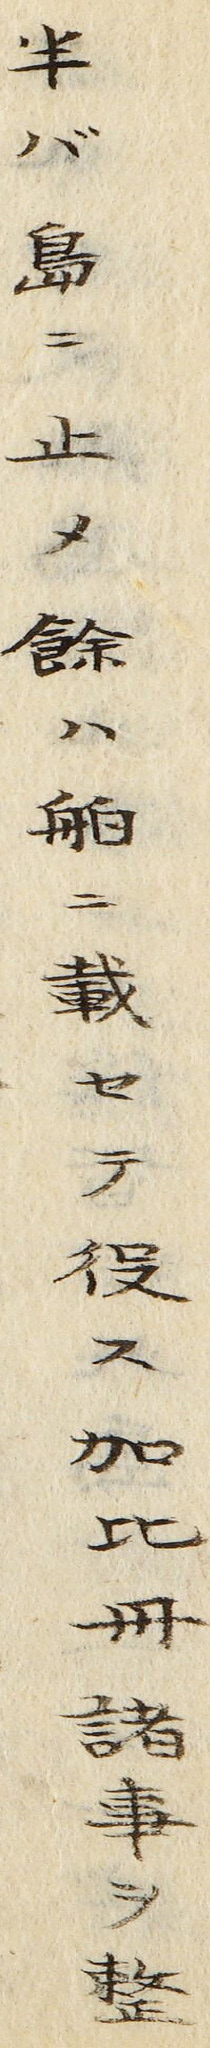半バ島ニ止メ余ハ舶ニ載セテ役ス加比丹諸事ヲ整
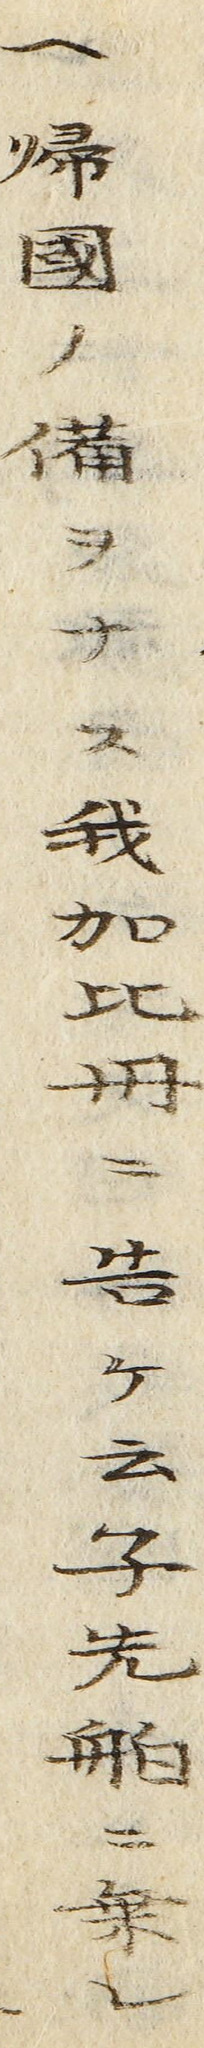ヘ帰国ノ備ヲナス我加比丹ニ告ケ云子先舶ニ乗レ
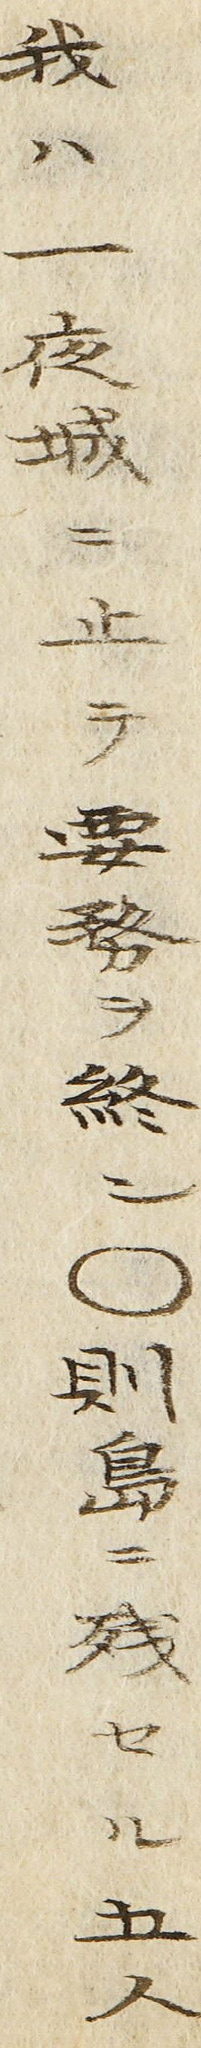我ハ一夜城ニ止テ要務ヲ終ン◯則島ニ残セル五人
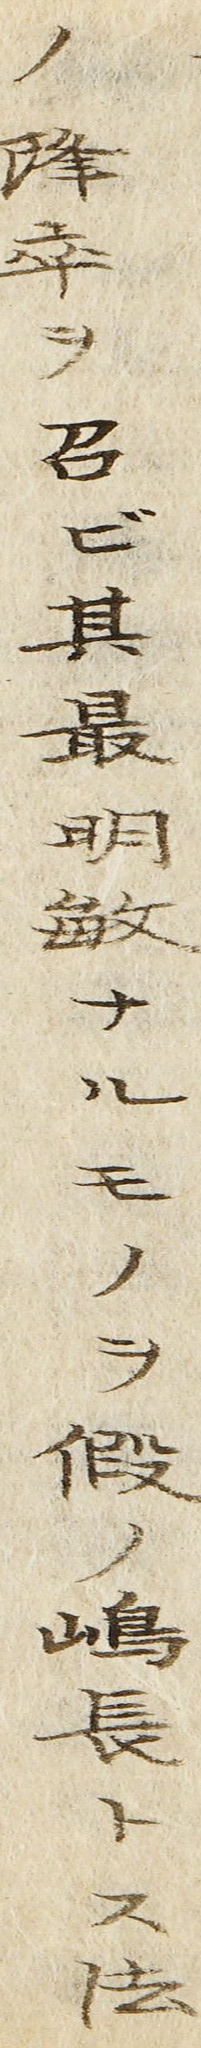ノ降卒ヲ召ビ其最明敏ナルモノヲ仮ノ嶋長トス法
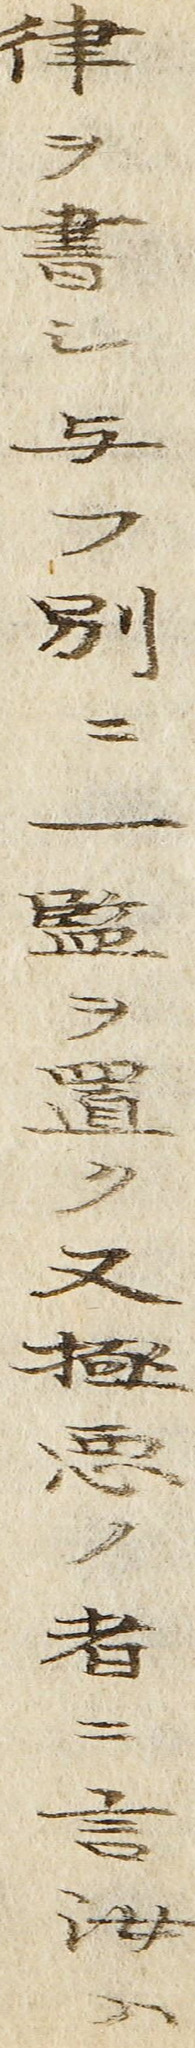律ヲ書シ与フ別ニ一監ヲ置ク又極悪ノ者ニ言汝ハ
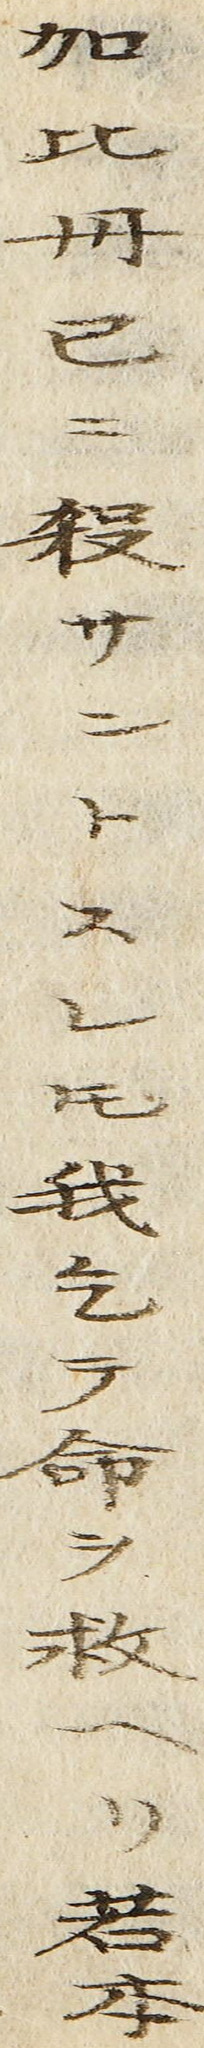加比丹已ニ殺サントスレトモ我乞テ命ヲ救ヘリ若本
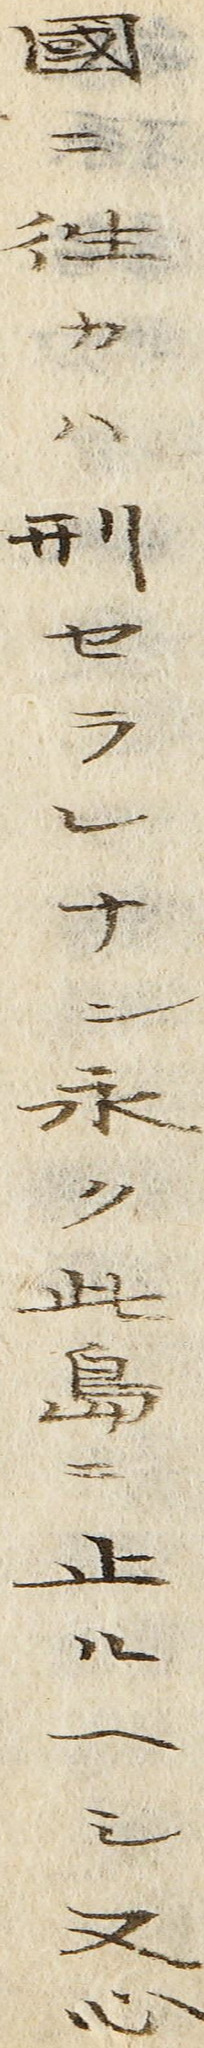国ニ往カハ刑セラレナン永ク此島ニ止ルヘシ又心
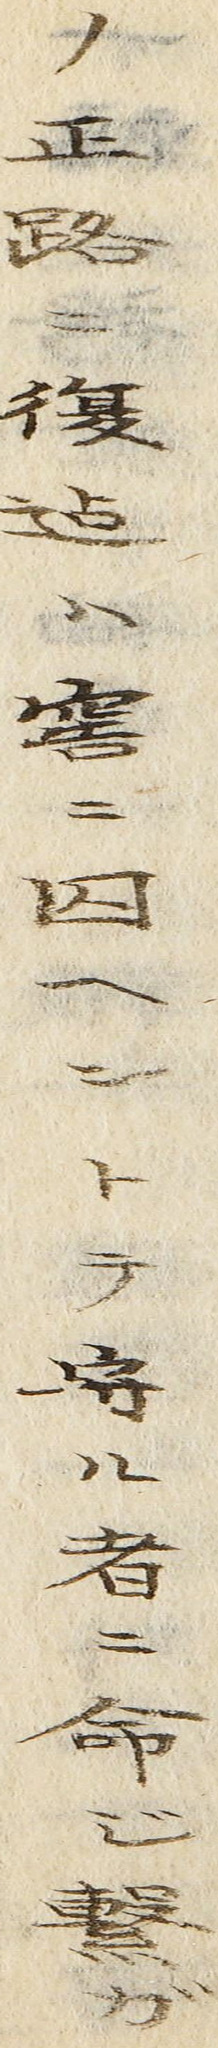ノ正路ニ復迄ハ窖ニ囚ヘントテ守ル者ニ命ジ繋ガ
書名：漂流紀事
